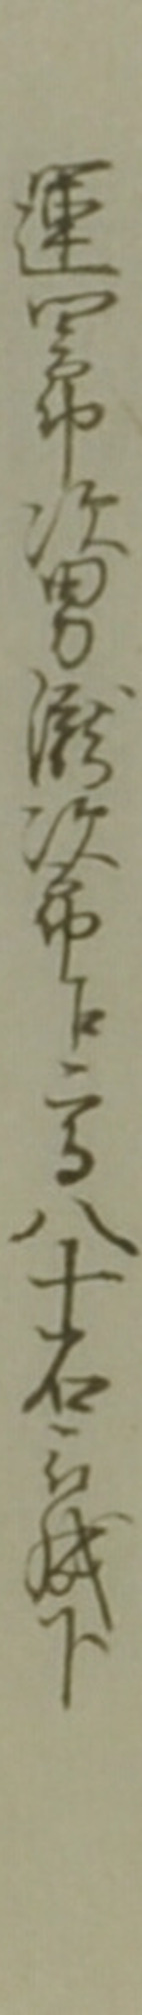運四郎次男瀧次郎え高八十石被成下
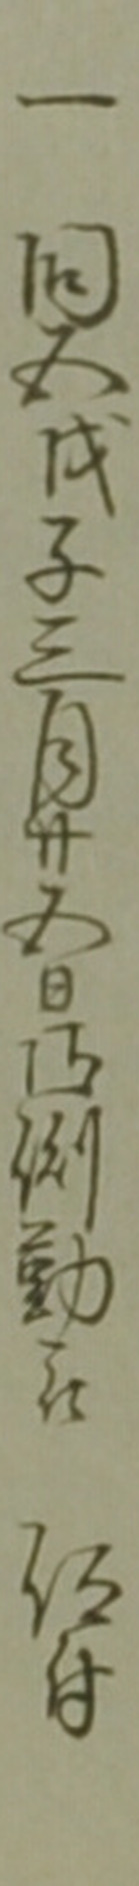一同五戊子三月廿五日御側勤被仰付
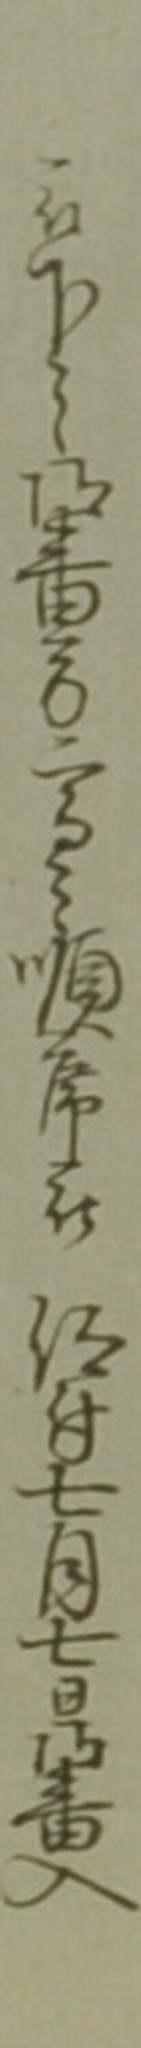被下之御番方高之順席被仰付七月七日御番入
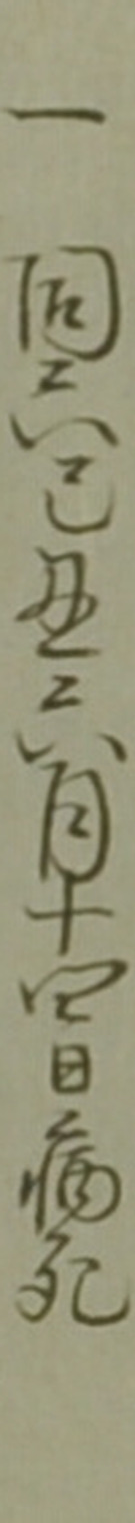一同六己丑六月十四日病死
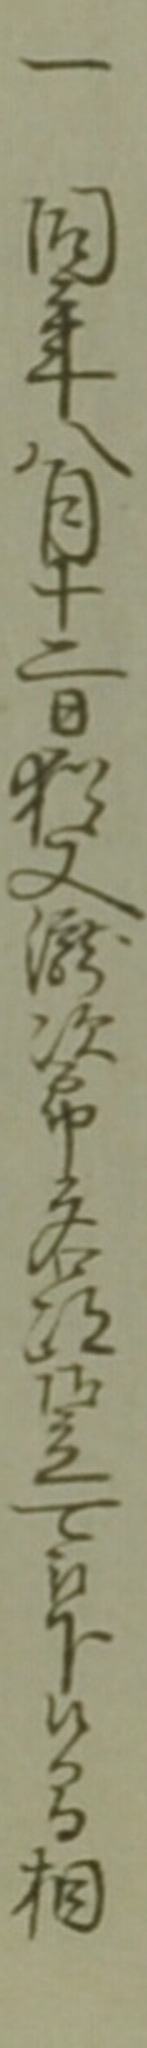一同年八月十二日猶又瀧次郎名跡御立可被下候間相
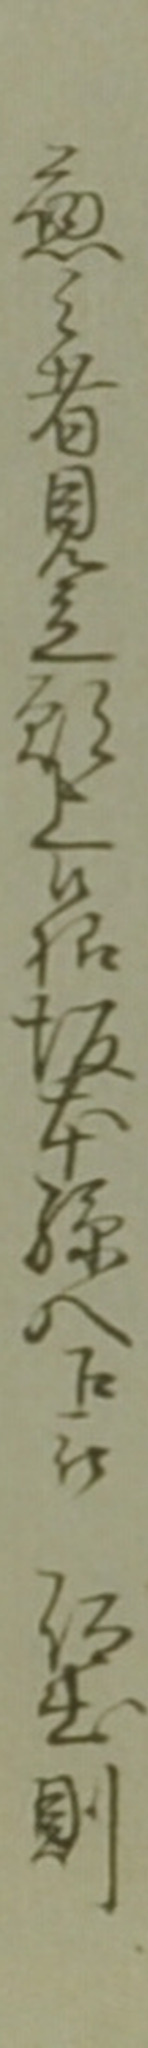応之者見立願上候様坂本孫八え被仰出則
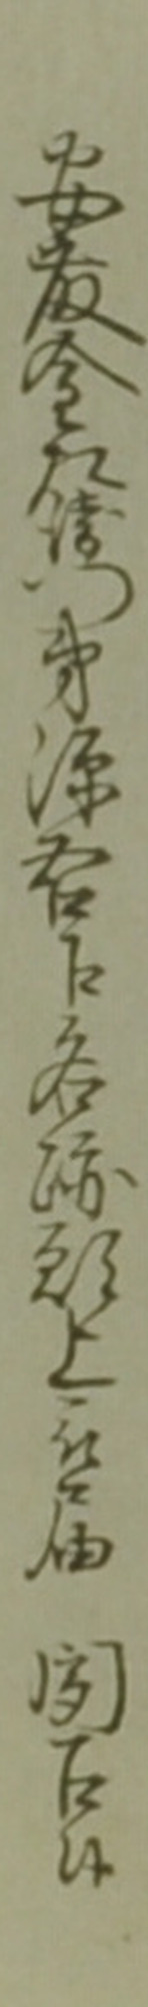安藤金左衛門弟源吾え名跡願上被届聞召候

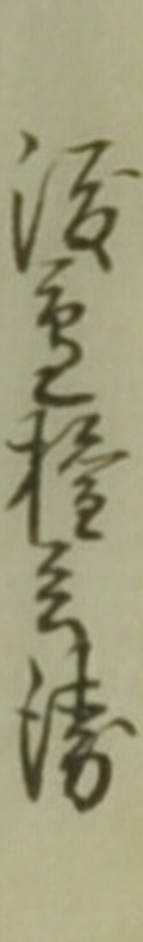渡辺権兵衛
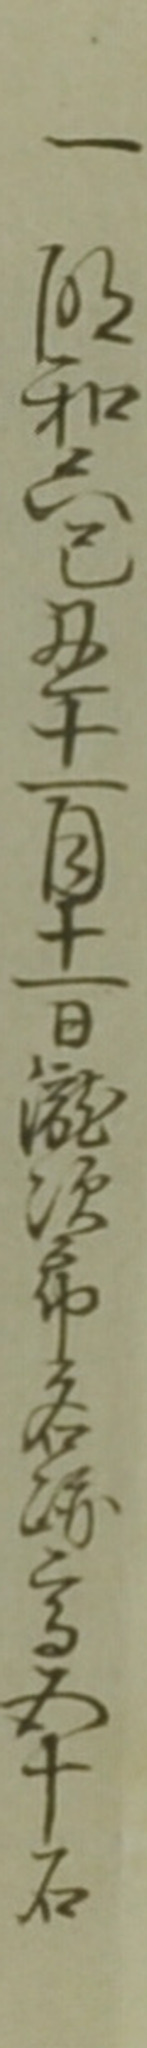一明和六己丑十一月十一日瀧次郎名跡高五十石
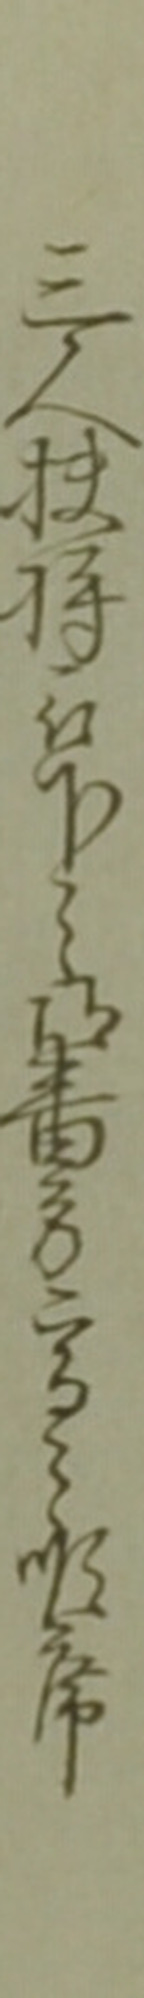三人扶持被下之御番方高之順席
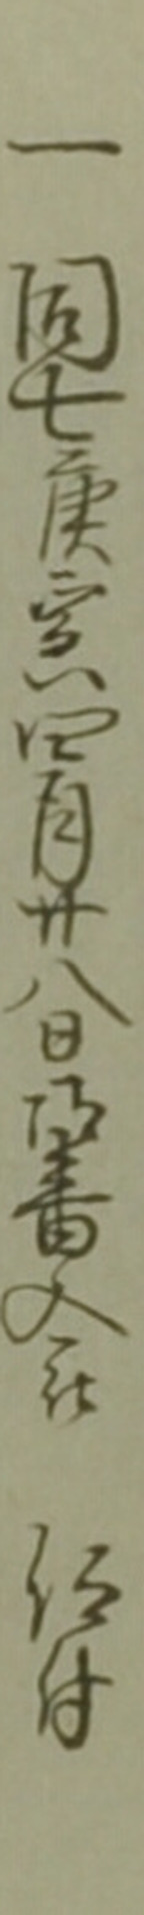一同七庚寅四月廿八日御番入被仰付
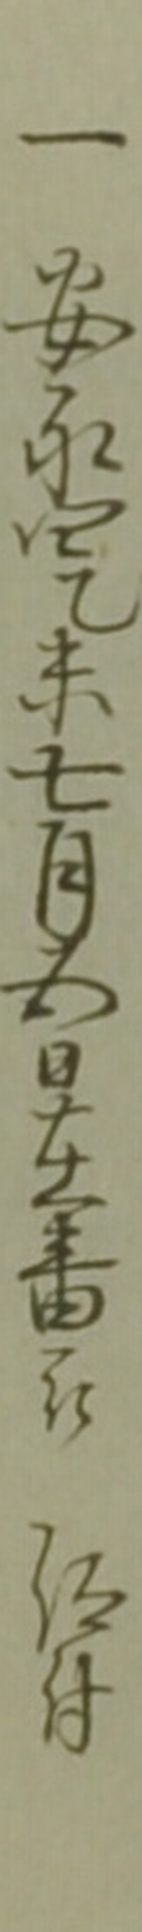一安永四乙未七月五日在番被仰付
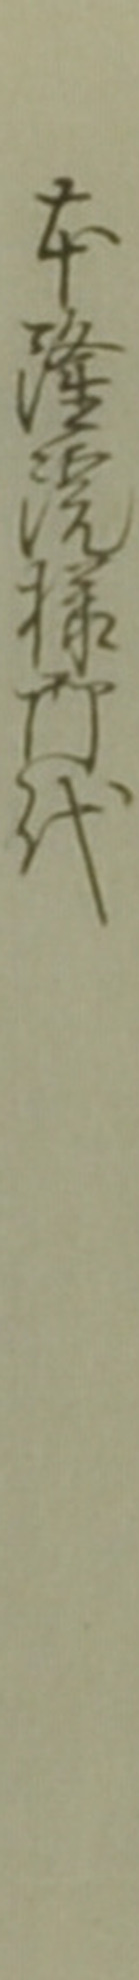本隆院様御代
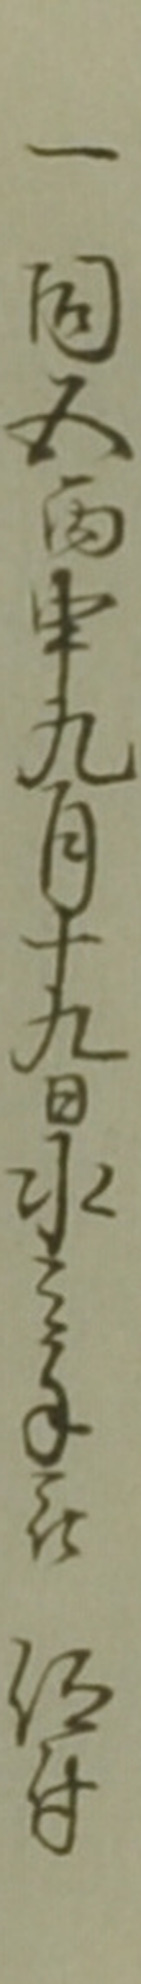一同五丙申九月十九日水之手被仰付
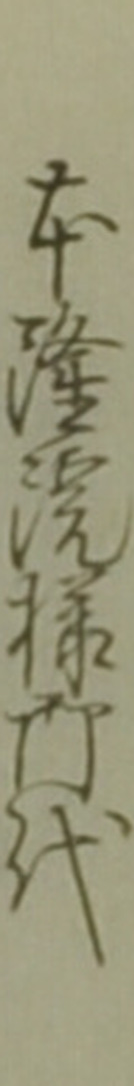本隆院様御代
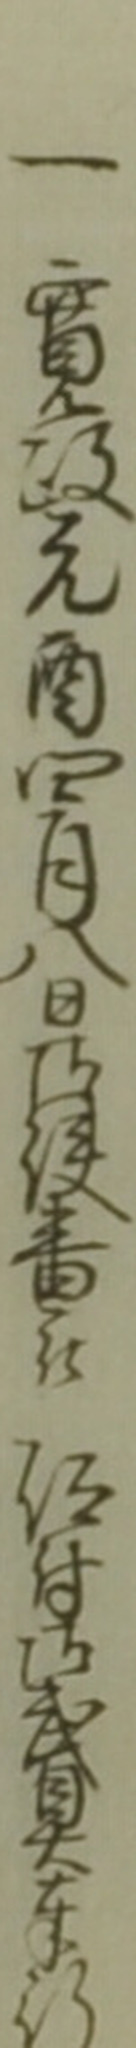一寛政元酉四月八日御使番被仰付御武具奉行
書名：給人諸士勤仕録（三）
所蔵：伊那市立高遠町図書館・合同会社AMANE
